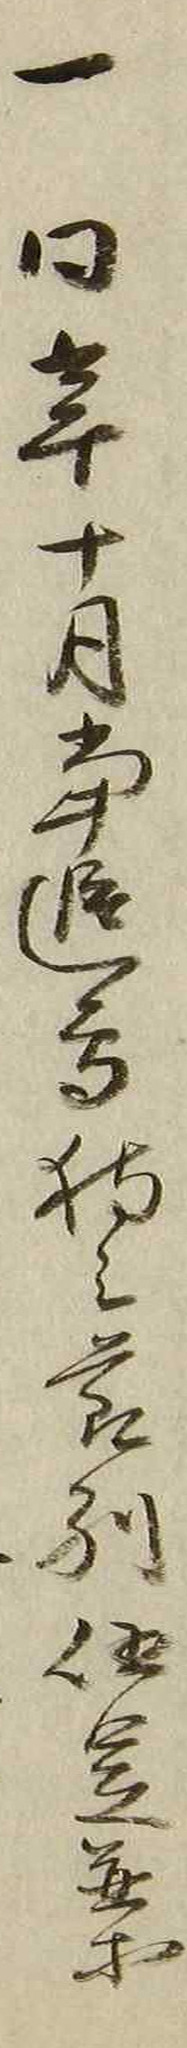一同年十月当追鳥狩之節列伍足並等
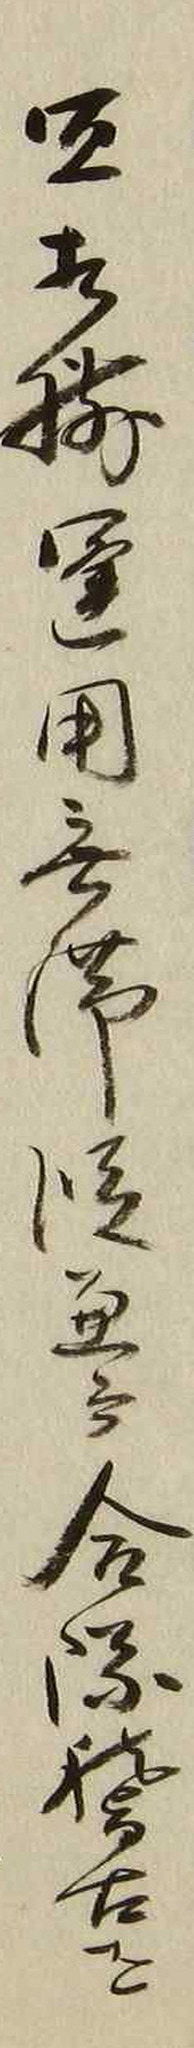宜相揃運用無滞段兼而合隊稽古を
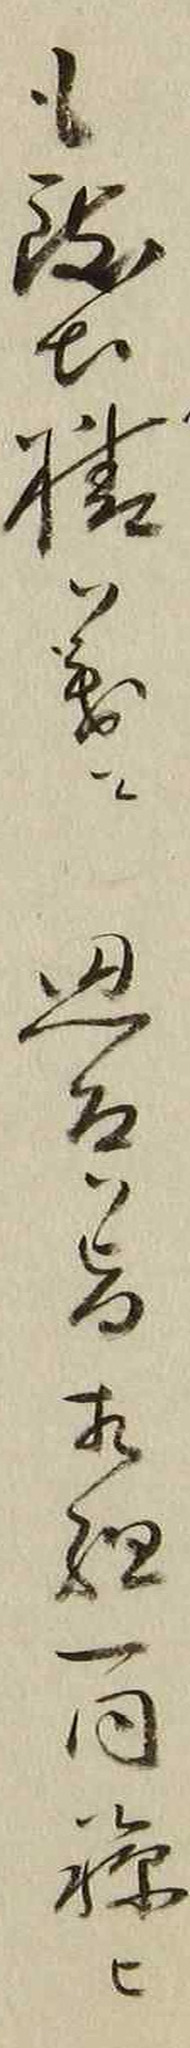も致出精候義と思召候旨相組一同御称被
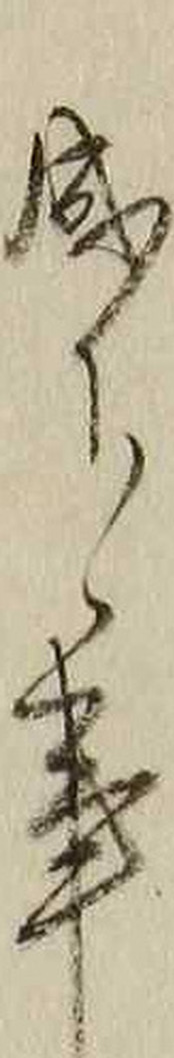成下候事
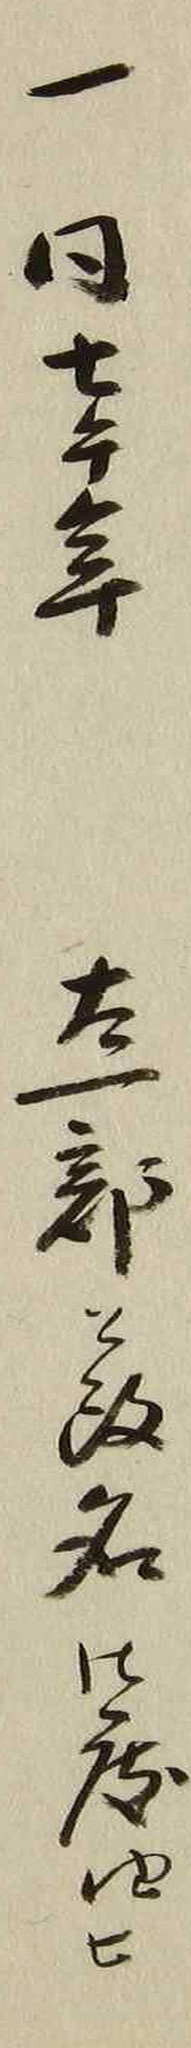一同七午年太一郎と改名仕度由被
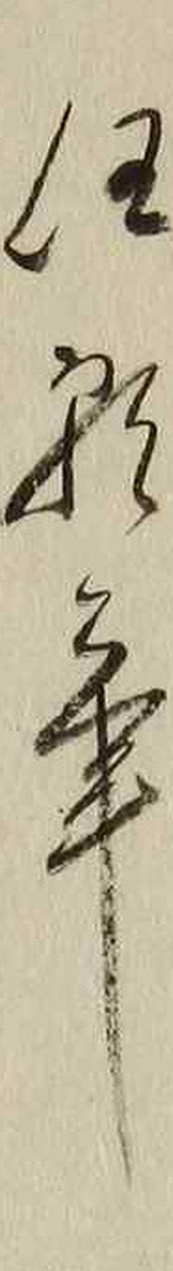任願候事
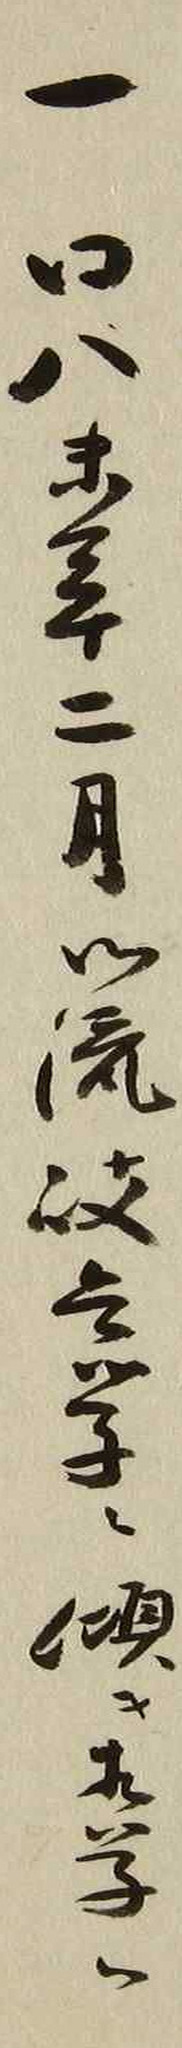一同八未年二月御流岐兵学ニ傾キ相学候
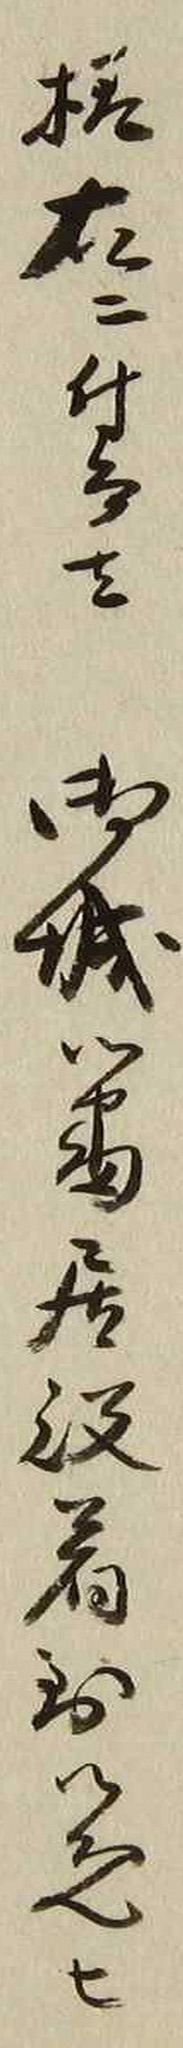様右二付而者御城御番居役着到御免被
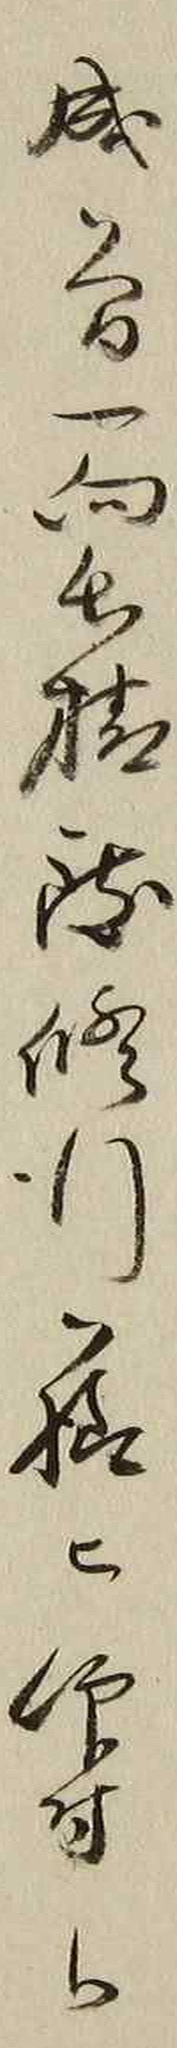成候間一向出精致修行候様被仰付候
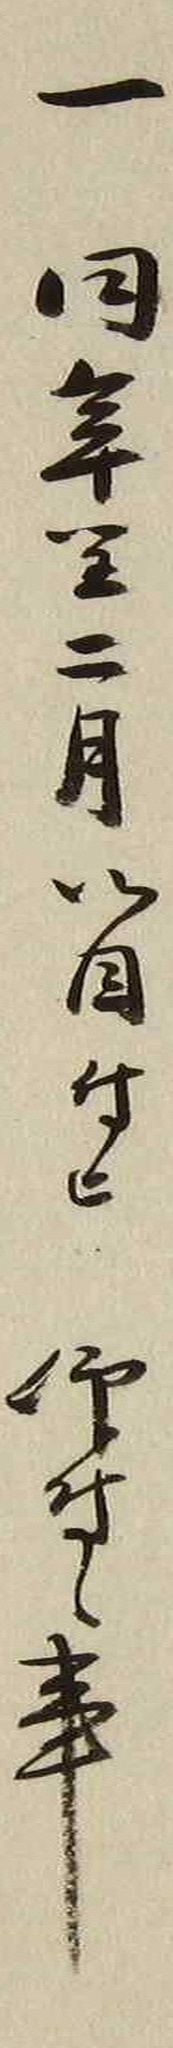一同年閏二月御目付被仰付候事
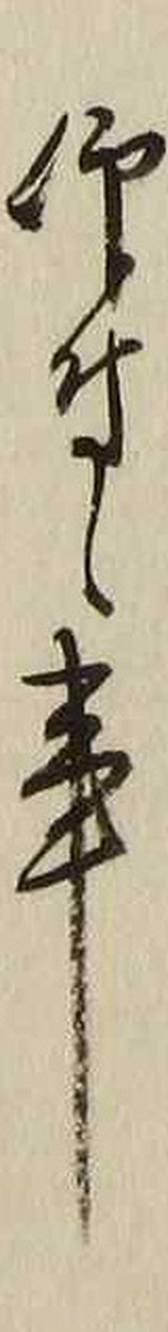仰付候事
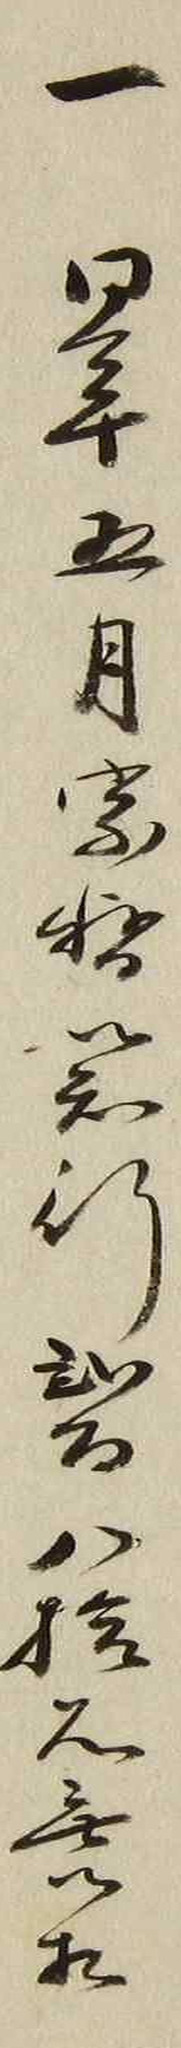一同年五月家督御知行弐百八拾石無御相
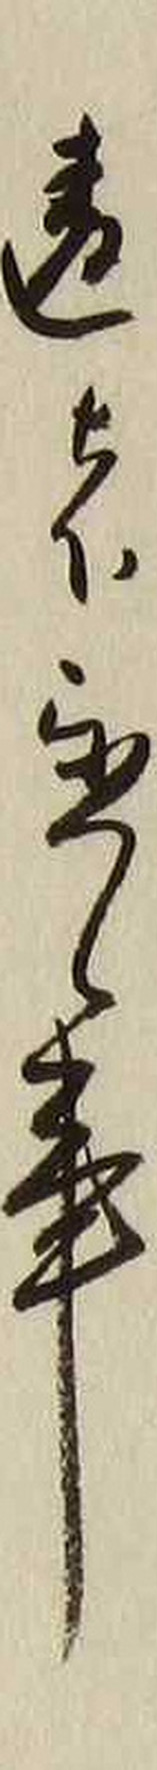違被下置候事
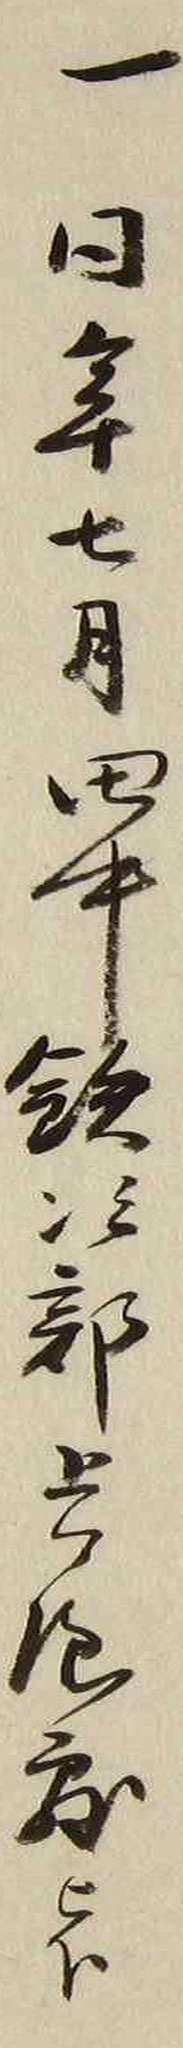一同年七月田中欽次郎上ヶ屋敷被下
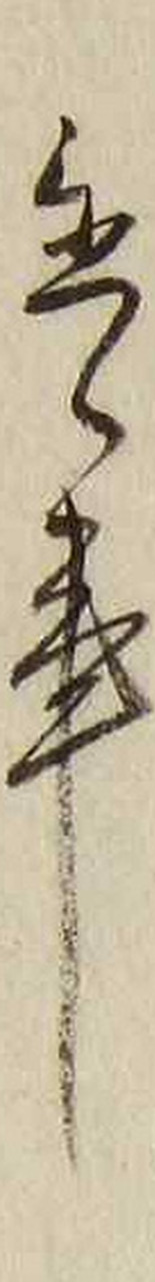置候事
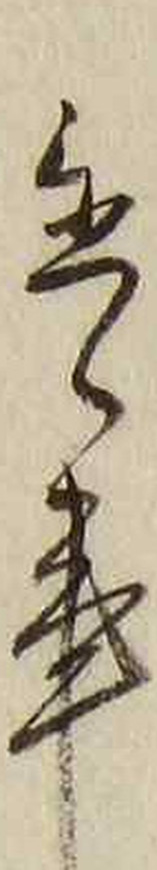置候事
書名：諸士系譜　巻之311　し之部1
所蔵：会津若松市立会津図書館
